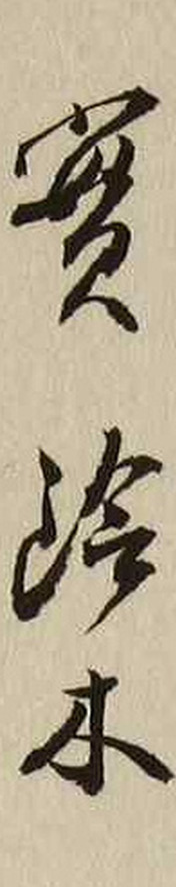実鈴木
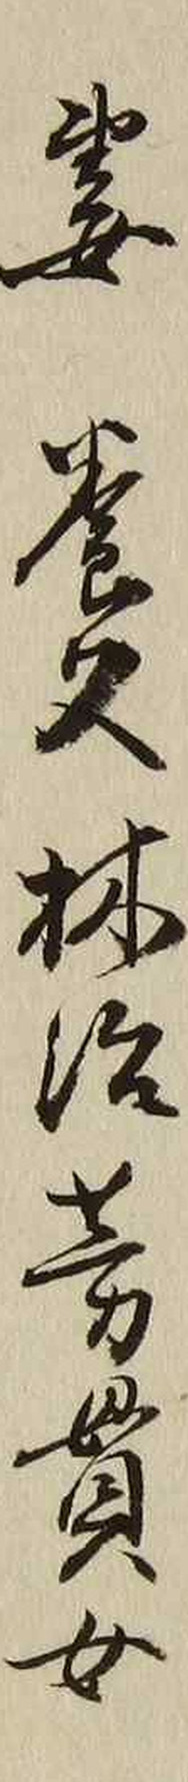妻養父林治芳貫女
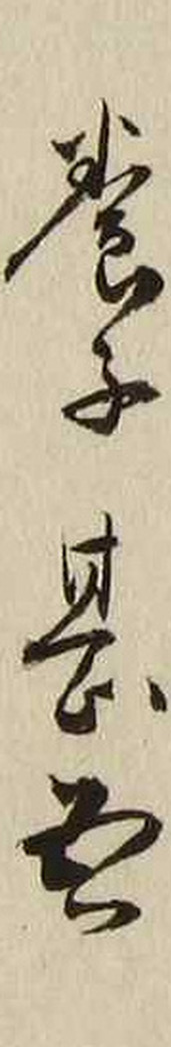養子甚吾妻
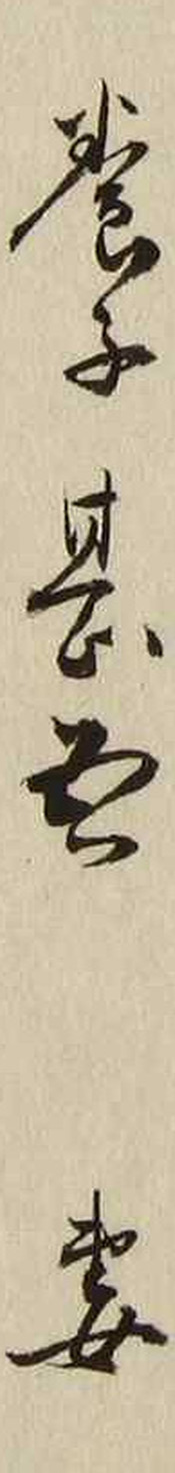養子甚吾妻

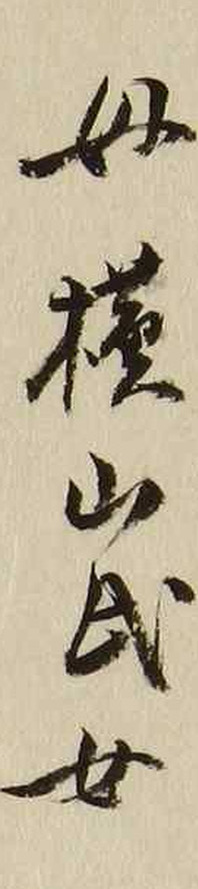母横山氏女
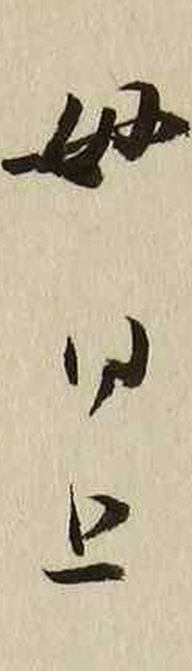母同上
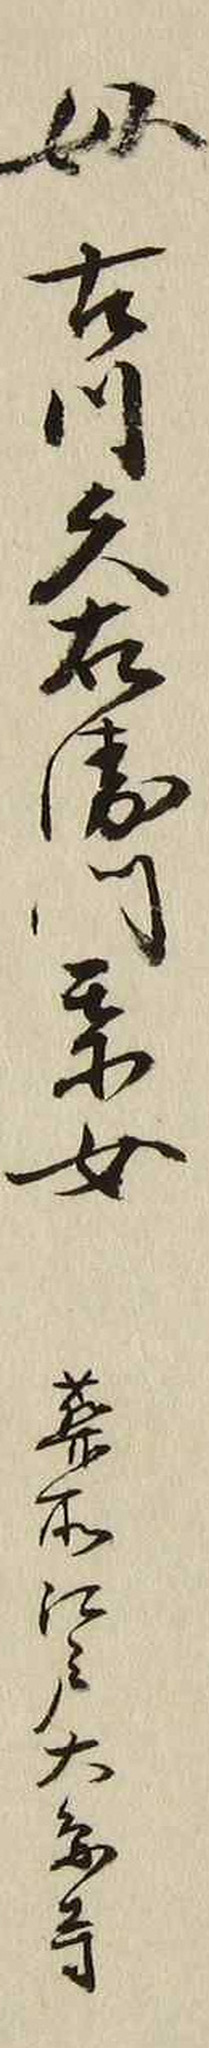母古川久右衛門某女葬所江戸大円寺
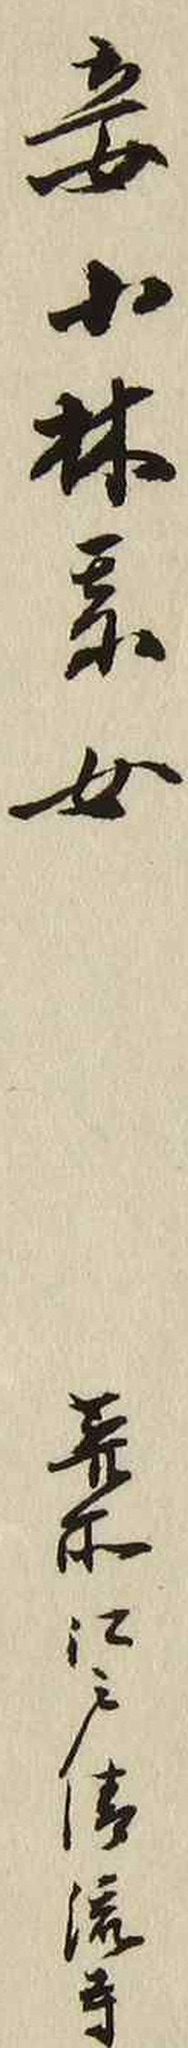妻小林某女葬所江戸清流寺
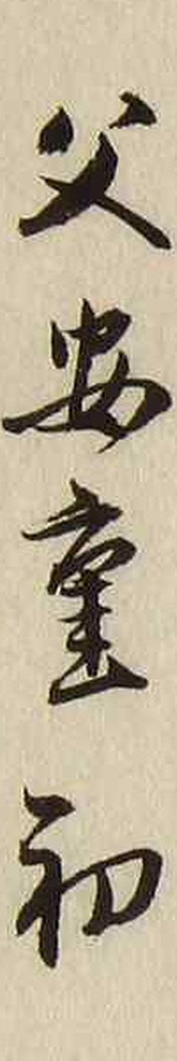父安重初
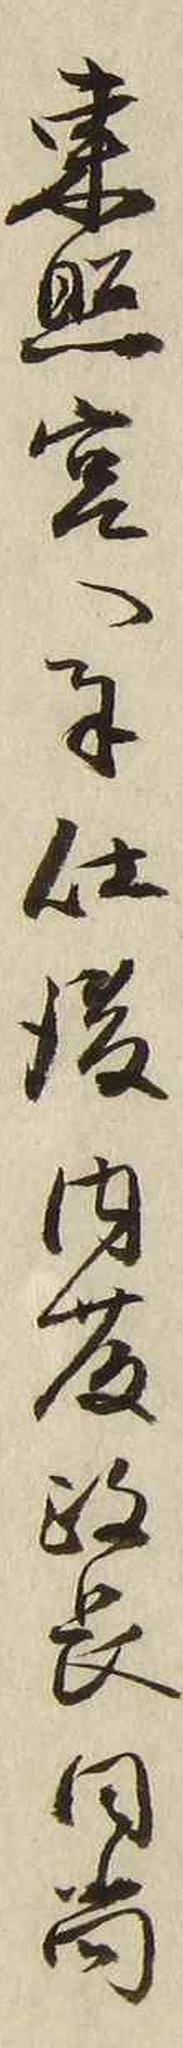東照宮へ奉仕後内藤政長同尚

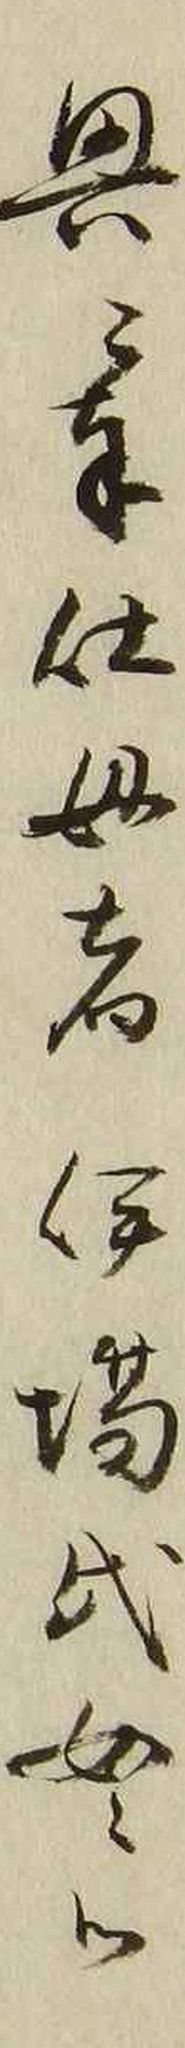興ニ奉仕毋者伊場氏女ニ候
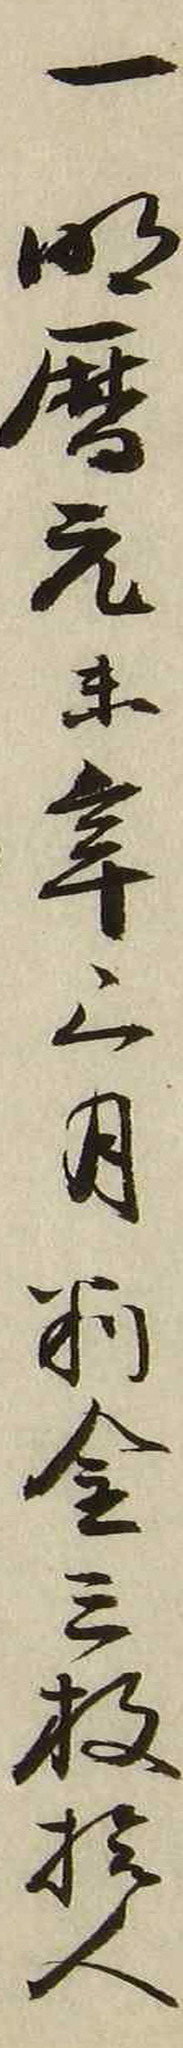一明暦元未年三月判金三枚拾人
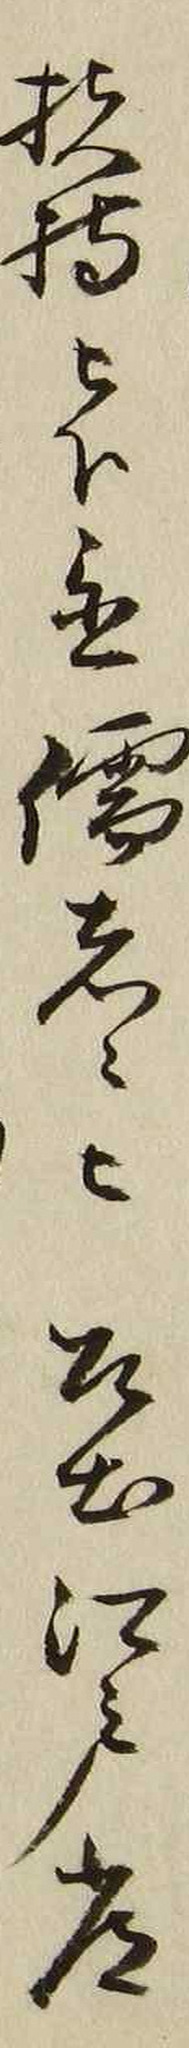扶持被下置儒者ニ被召出江戸常
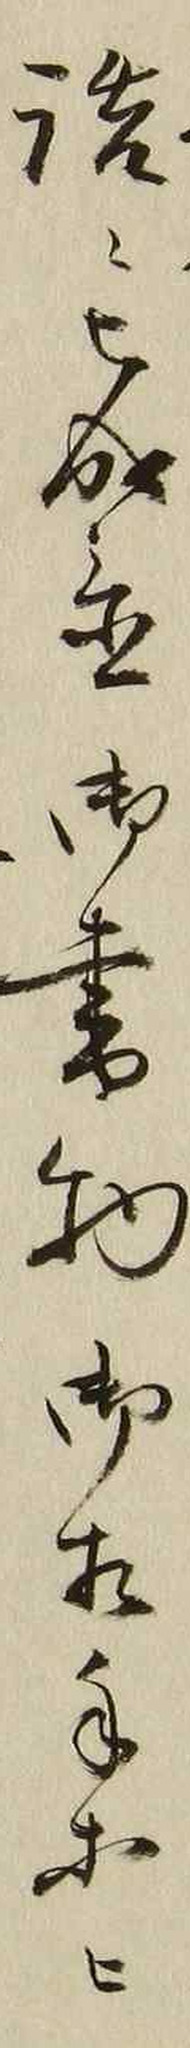詰ニ被成置御書物御相手等被
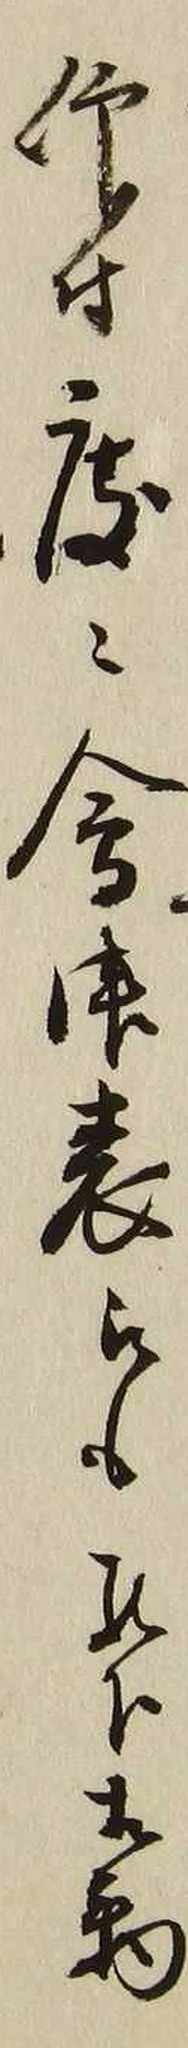仰付度々会津表江も罷下相勤
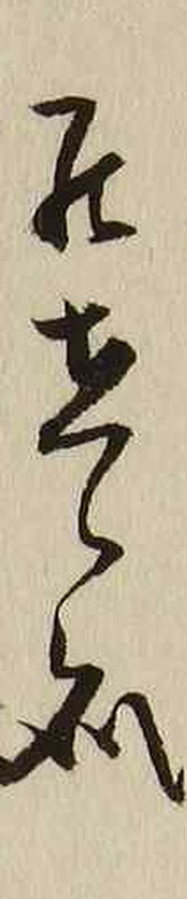罷在候処
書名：諸士系譜　巻之291　さ之部23
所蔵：会津若松市立会津図書館
